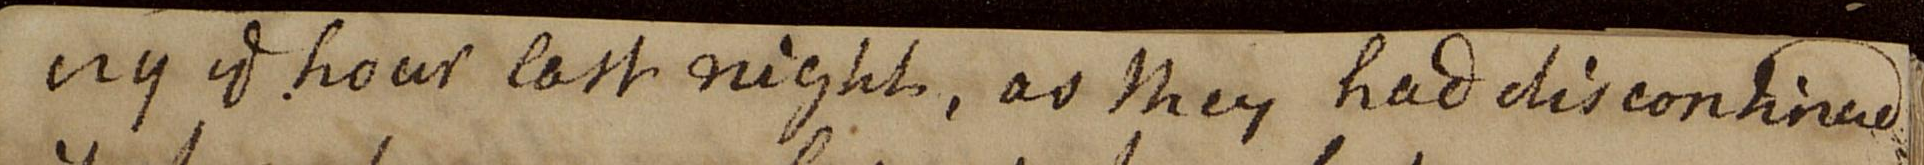cry y^e hour last nights, as they had discontinud
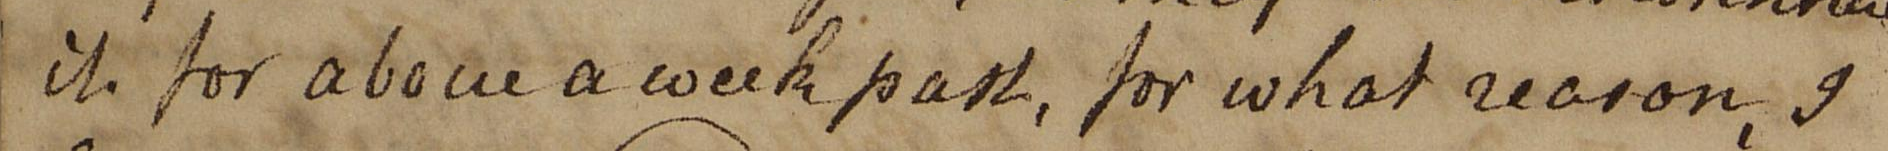it for above a week past, for what reason, I
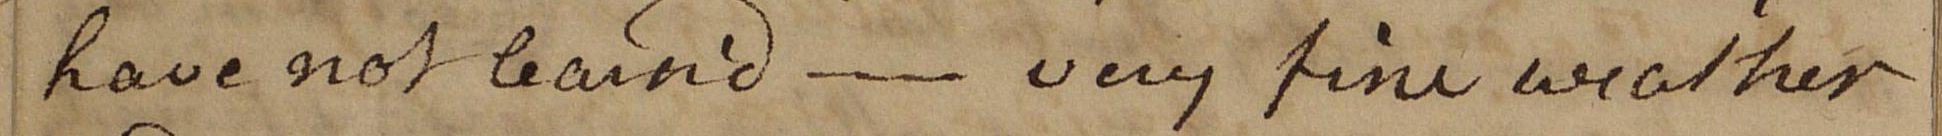have not learn'd- very fine weather
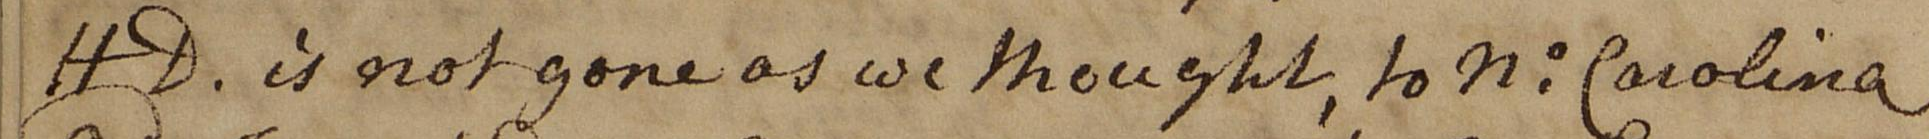HD. is not gone as we thought, to N^o. Carolina
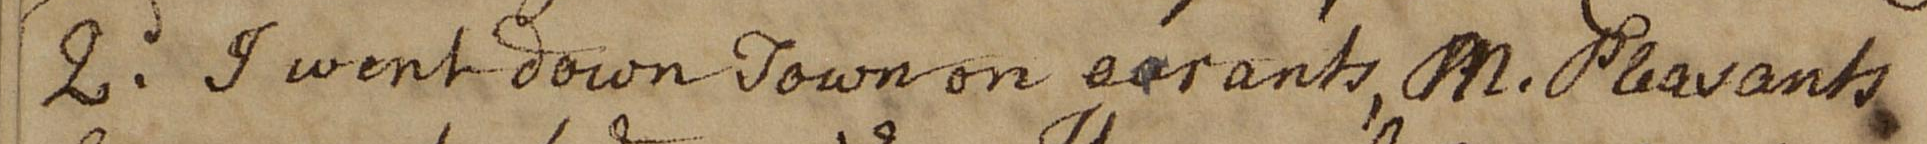2^d. I went down Town on earants, M. Pleasants
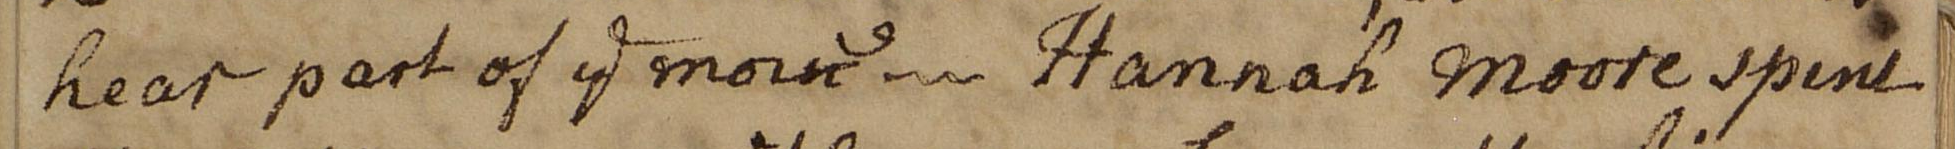hear part of y^e morn^g- Hannah Moore spent
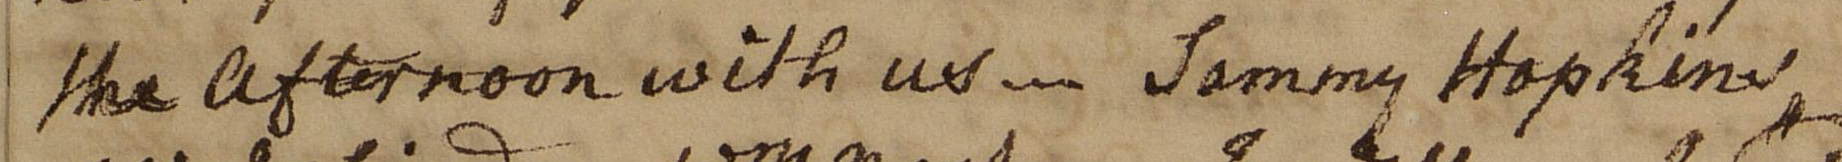the Afternoon with us- Sammy Hopkins
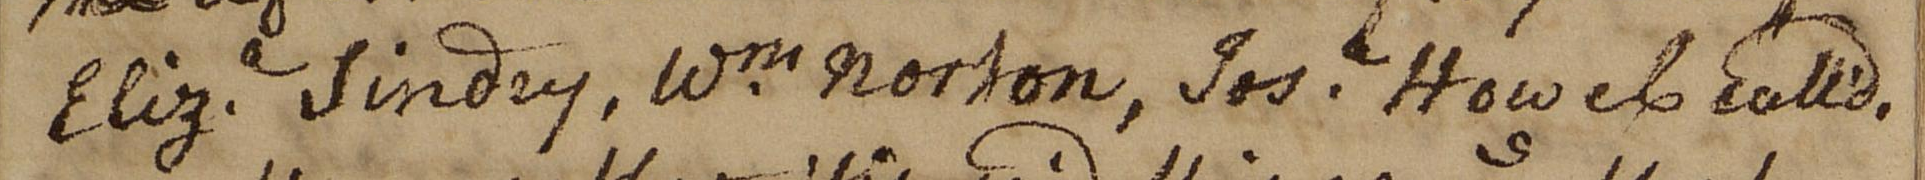Eliz^a. Sindry, W^m. Norton, Jos^a. Howel call'd,
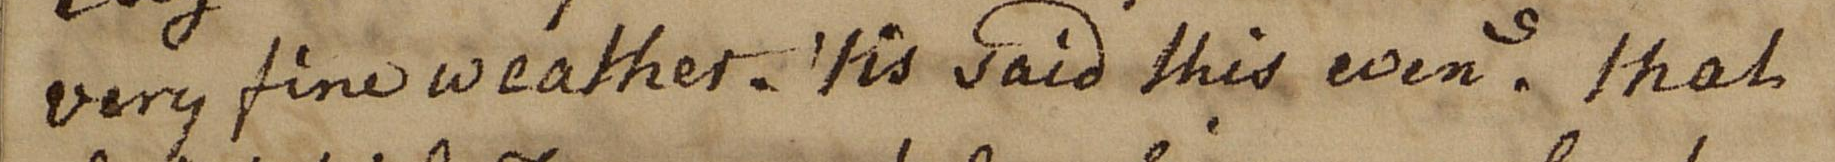very fine weather- 'tis said this even^g. that
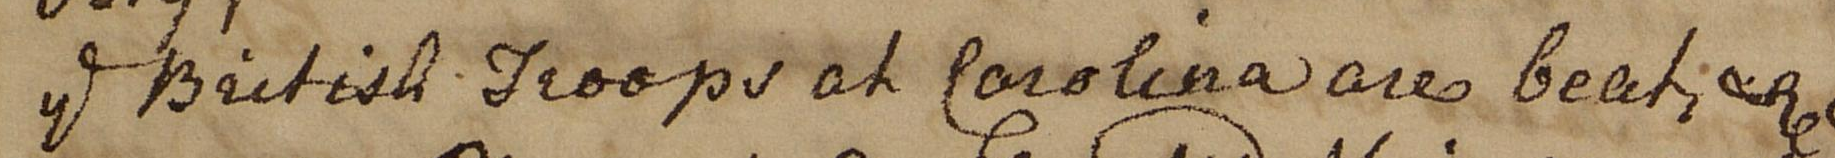y^e British Troops at Carolina are beat, &c
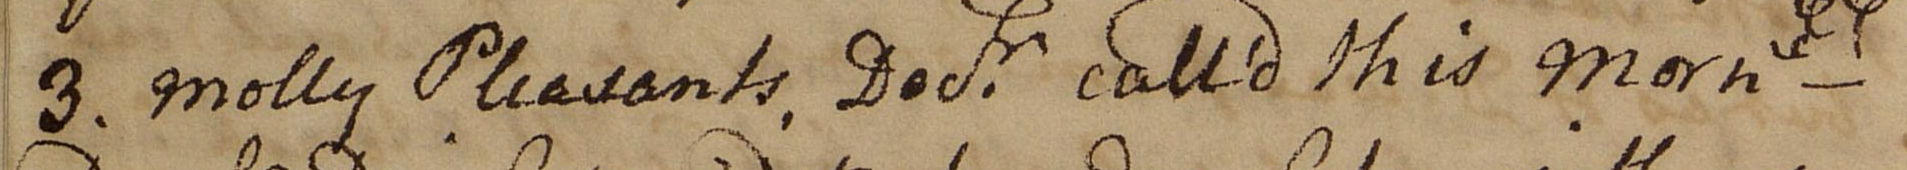3. Molly Pleasants, Doc^r call'd this morn^g-
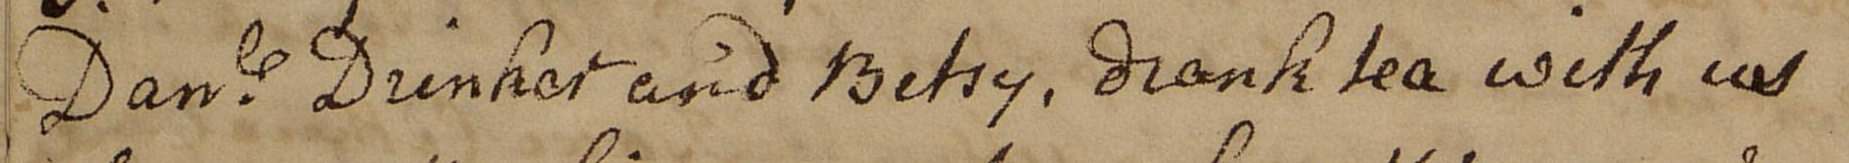Dan^l. Drinker and Betsy, drank tea with us
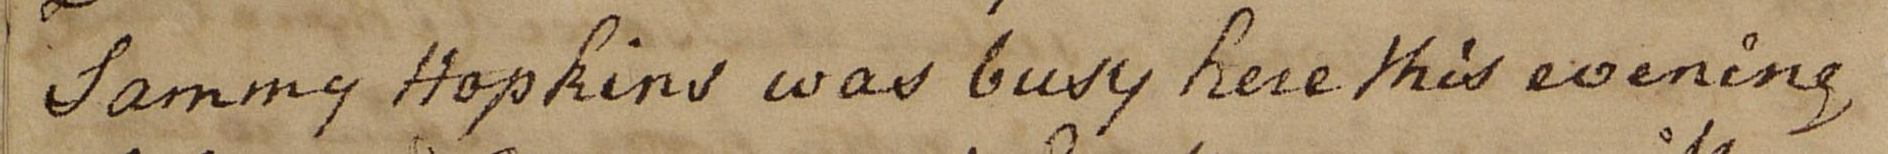Sammy Hopkins was busy here this evening
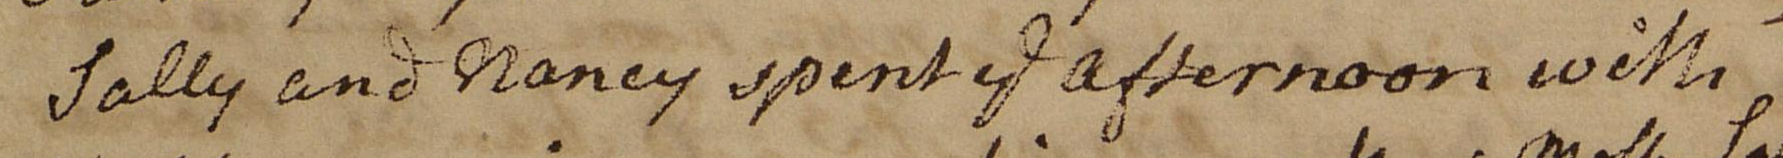Sally and Nancy spent y^e afternoon with
